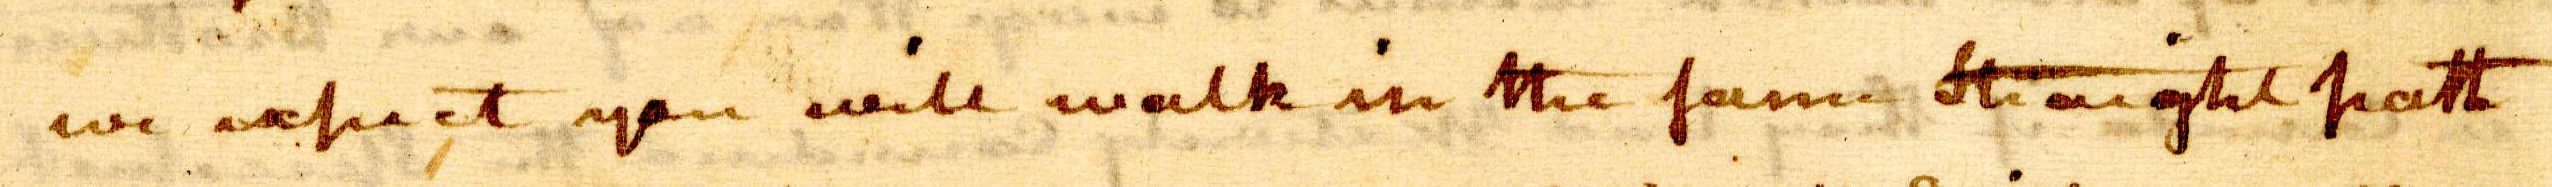we expect you will walk in the same Straight path
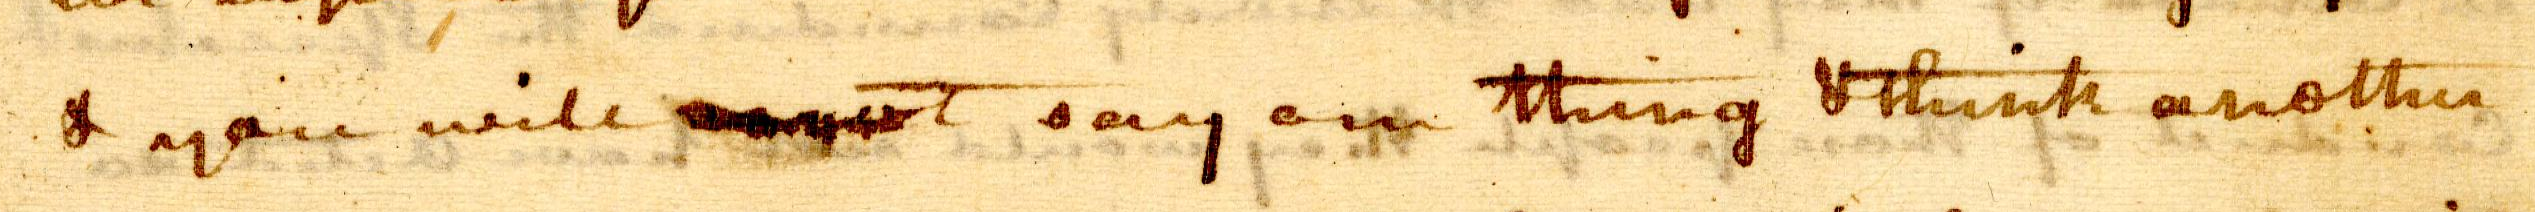& you will [___] say one thing & think another
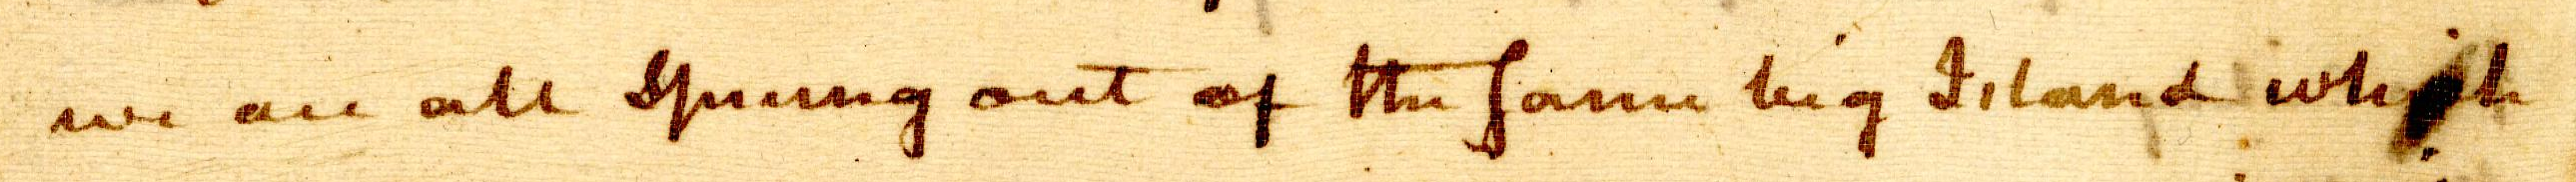we are all Sprung out of the Same big Island which
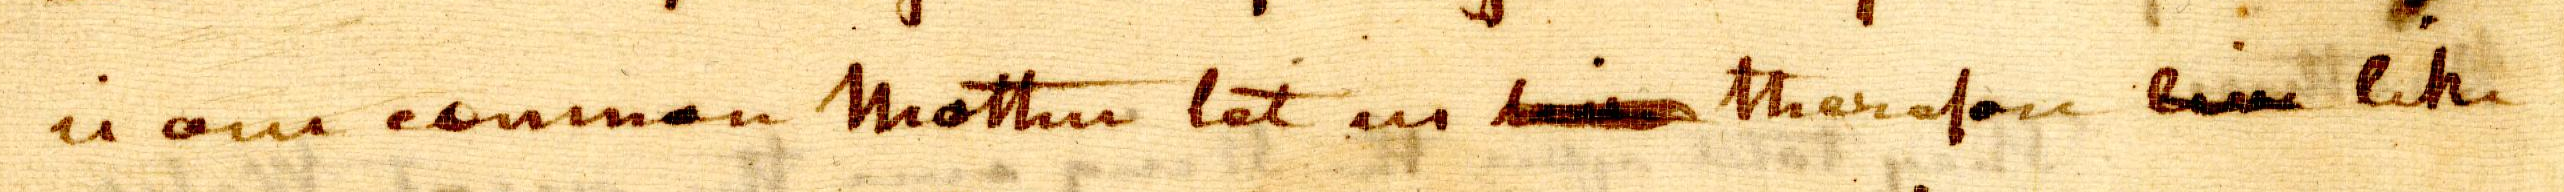as our common Mother let us[__] therefore [__] like
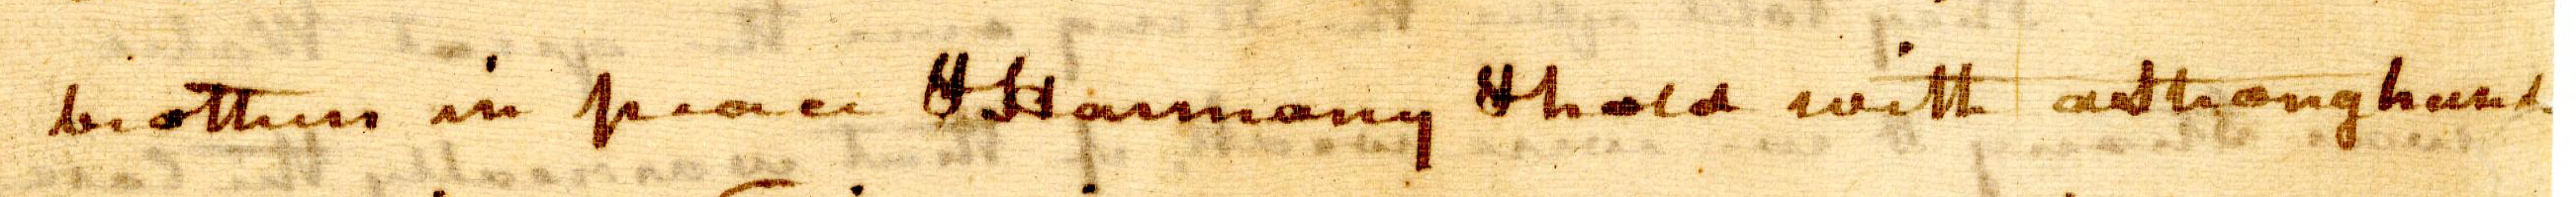be others in peace & Harmony & hold with a Strong hand
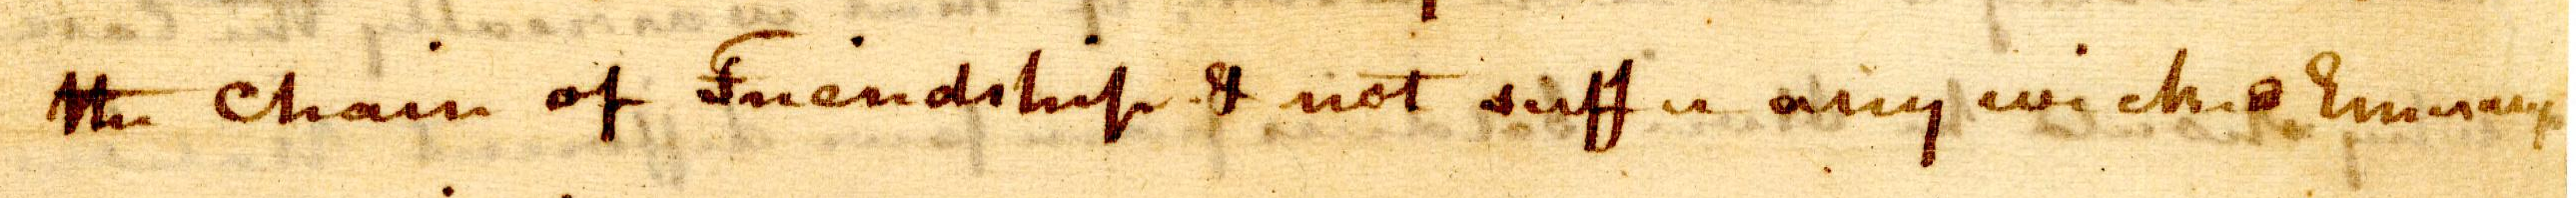the Chain of Friendship & not suffer any wicked Emergency
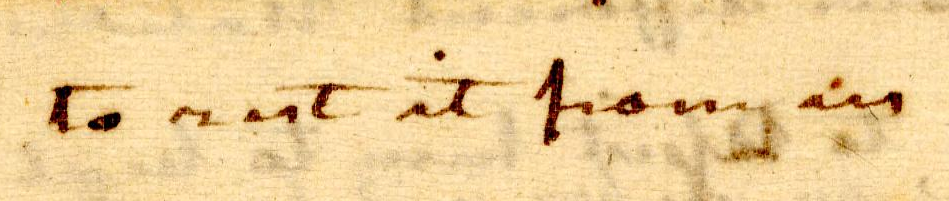to rest it from us
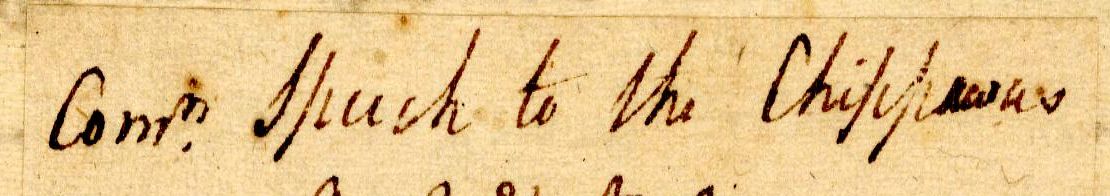Com^r. Speech to the Chippawas
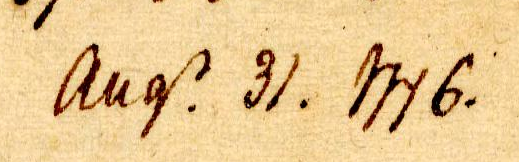Aug^t. 31. 1776.
